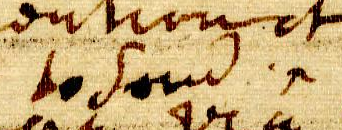to Send
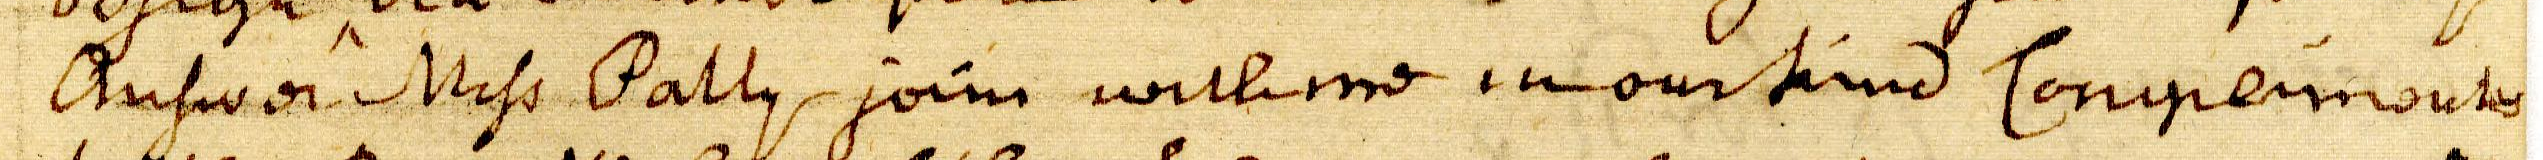Answer Miss Patty joins with me in our kind Compliments
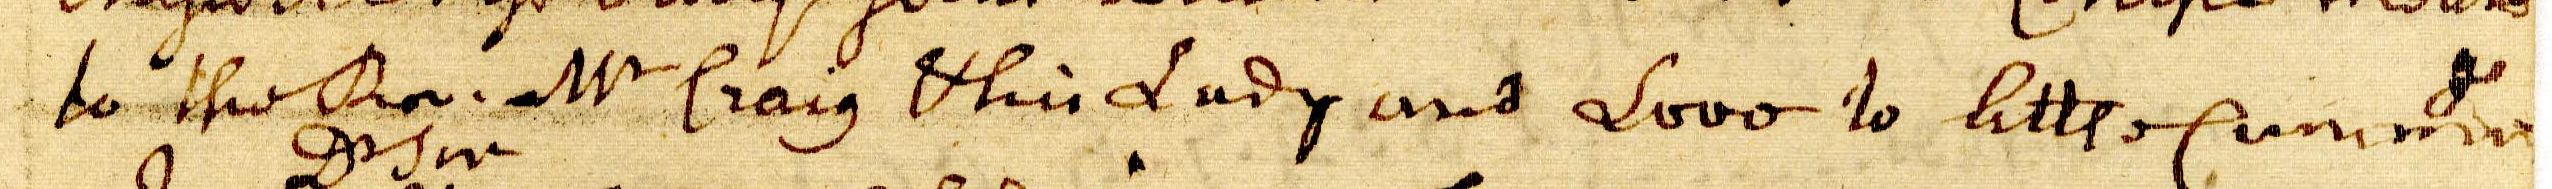to the Rev. M^r Craig & his Lady and Love to Little Cummin^gs
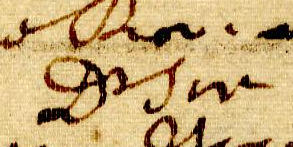D^r Sir
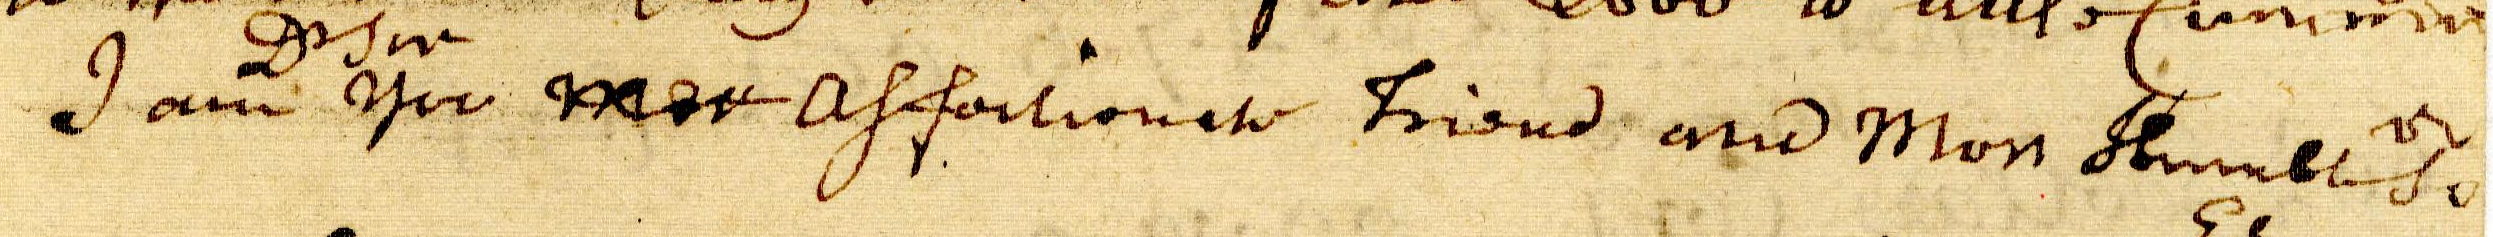I am You [Mos] Affectionate Friend and Most Humble Se^vt.
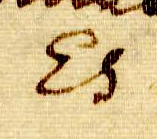ES
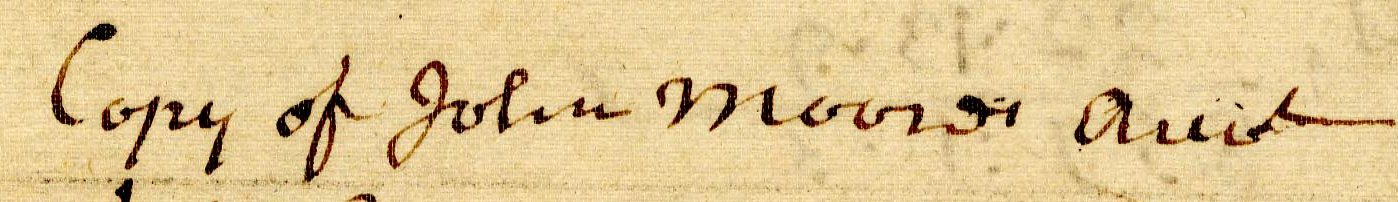Copy of John Moores Acco^t
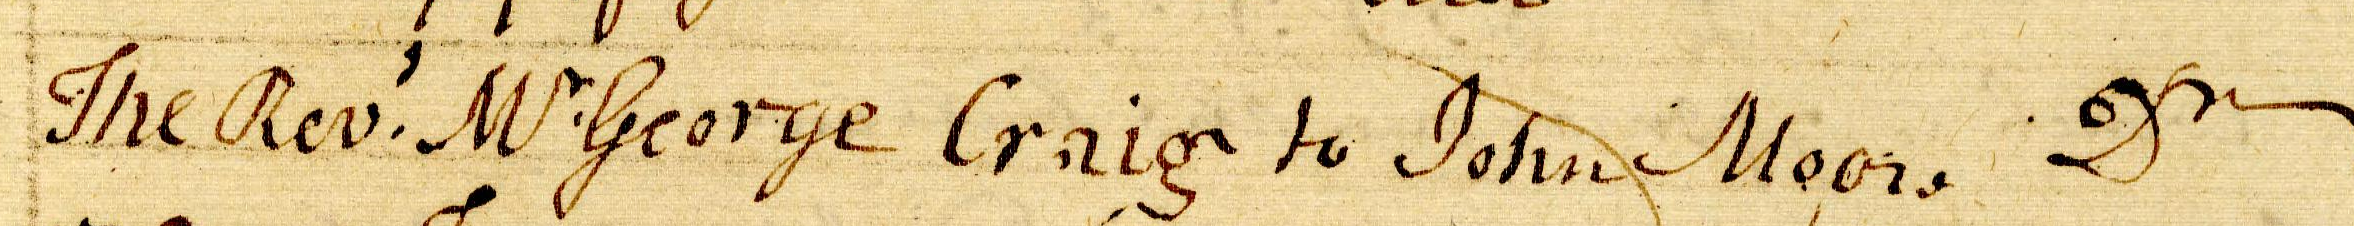The Rev^d. M^r George Craig to John Moore D^r
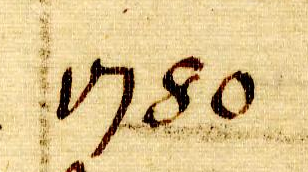1780
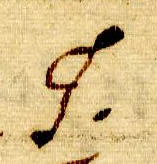J.
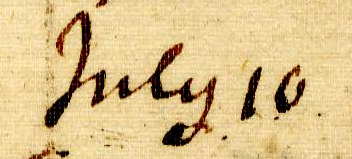July 10
